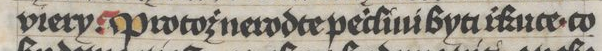viery?Protoż nerodte peċliui byti ṙkuce.co
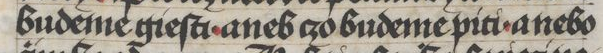budeme gíeſti.aneb czo budene píti.a nebo
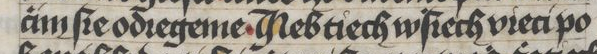ċím ſie odiegeme.Neb tiech wẛiech viecí po¬
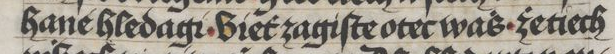hane hledagí.Víeṫ zagiſte otec waṡ.że tiech
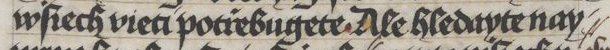wẛiech vietí potṙebugete.Ale hledayte nay¬
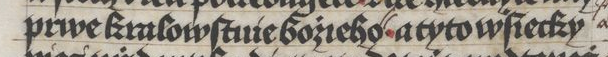prwe kralowſtuíe bożieho.a tyto wẛiecky.
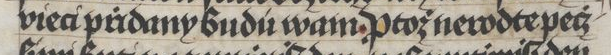vieci pṙidany budú wam.Ꝓtoż nerodte pecż¬
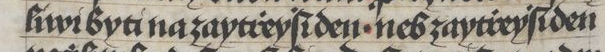liwi byti na zaytṙeyẛi den.neb zaytṙeyẛi den
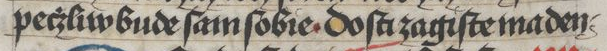pecżliw bude ſam ſobie.doſti zagiſte ma den
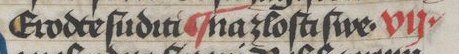Erodte ſuditi na zloſti ſwe.vij.
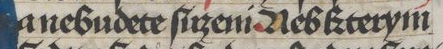a nebudete ſuzeni.Neb kterym
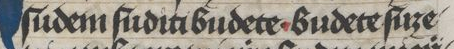ſudem ſuditi budete.budete ſuze¬
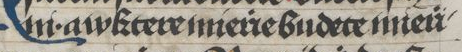ni.awktere míeṙe budete mieṙi¬
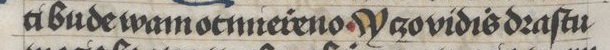ti bude wam otmieṙeno.Y czo vidiš draſtu
